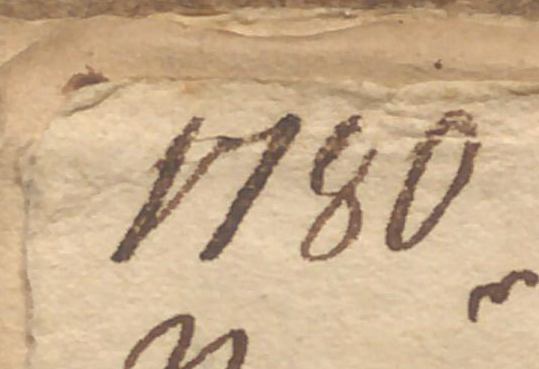1780
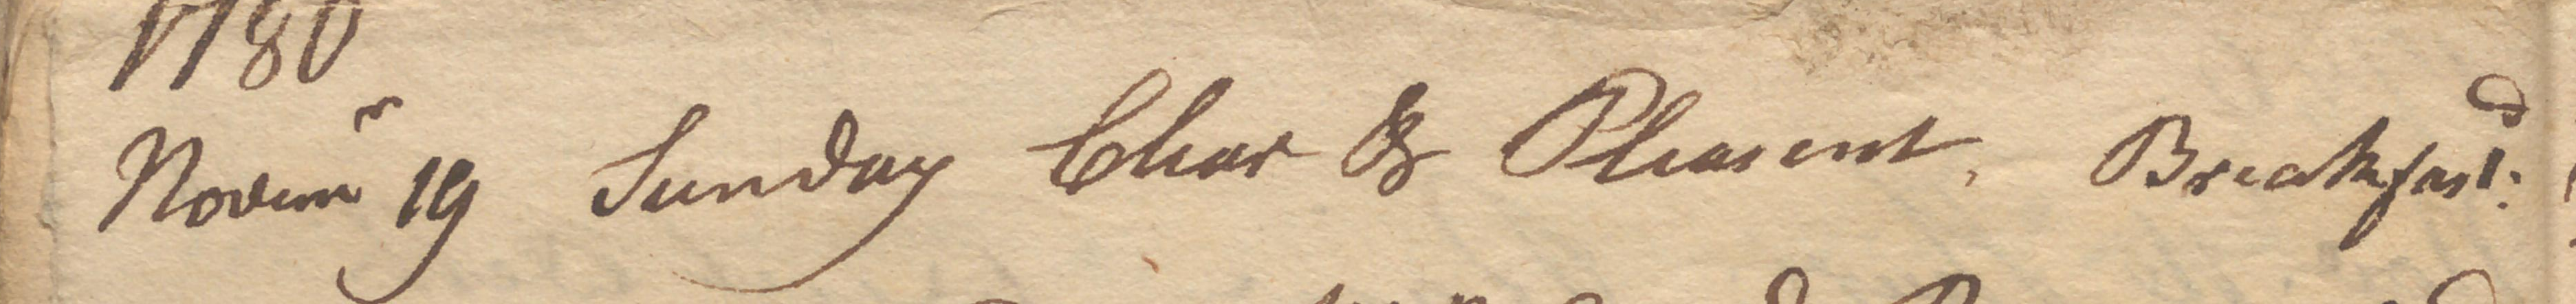Novem^r 19 Sunday Clear & Pleasent. Breakfast^d:
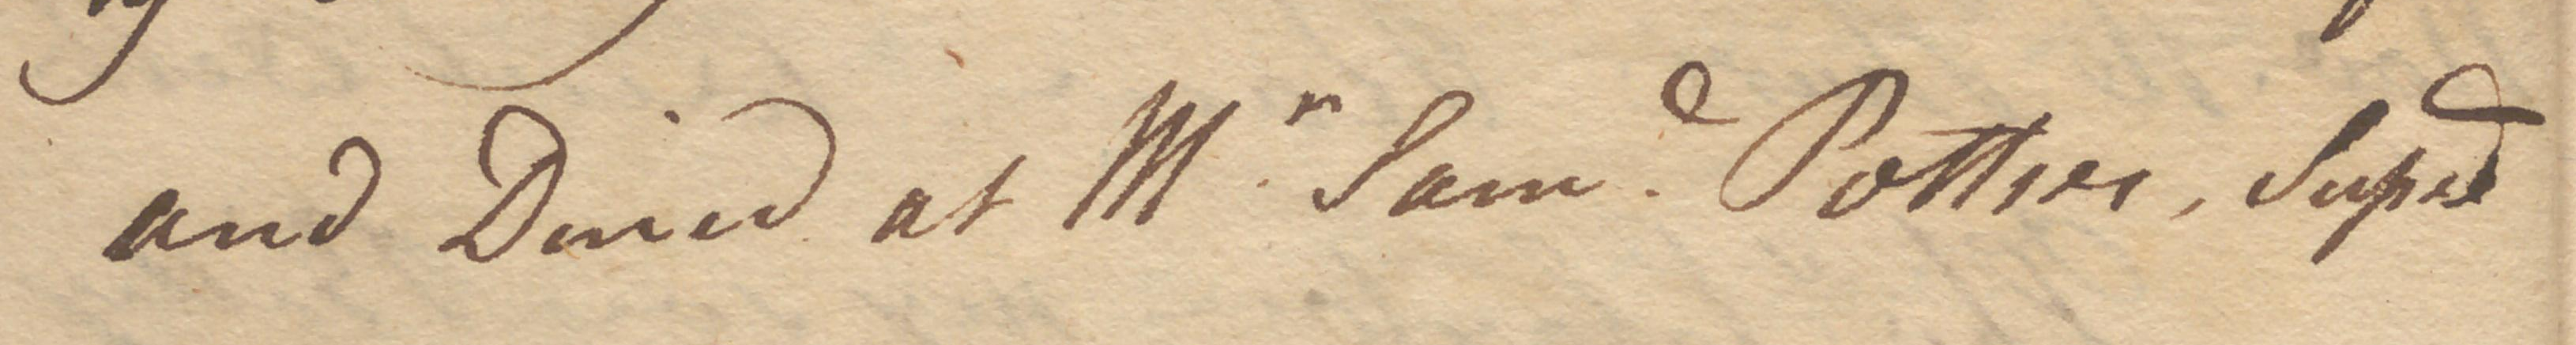and Dined at M^rs. Sam^l. Pottses, Suped
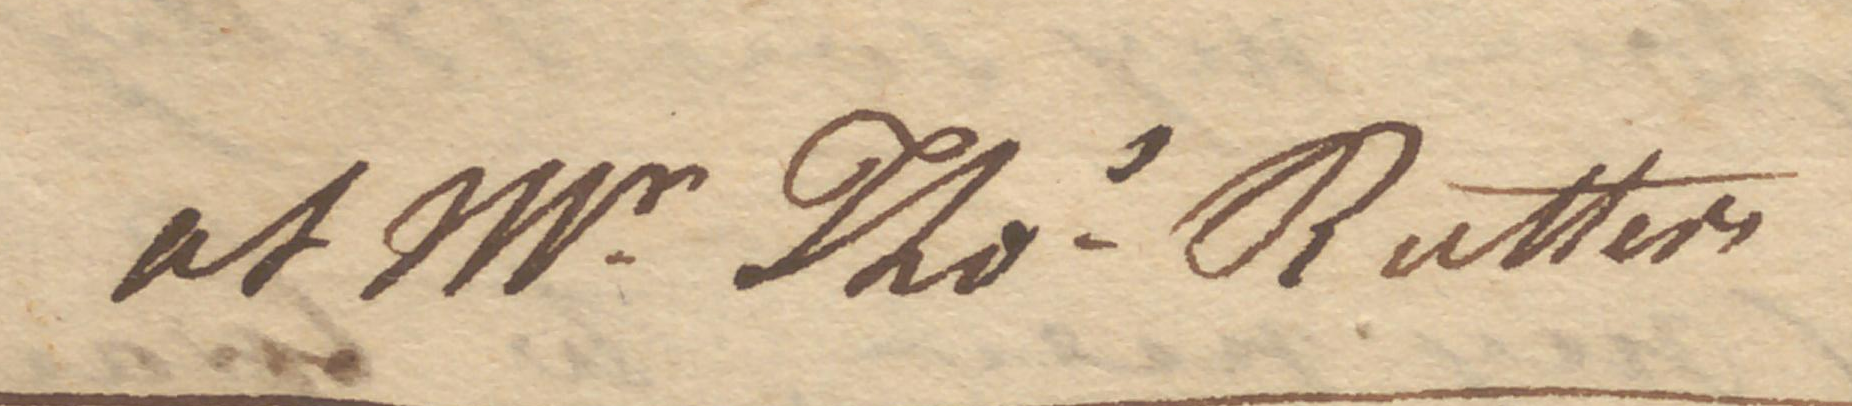at M^r. Tho^s. Rutters
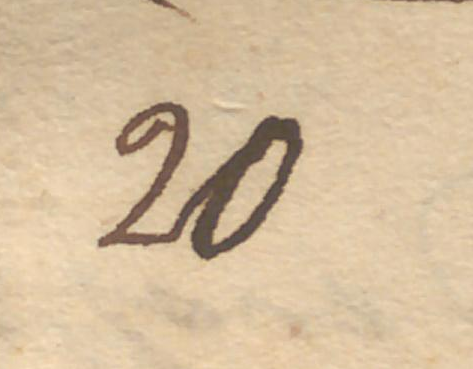20
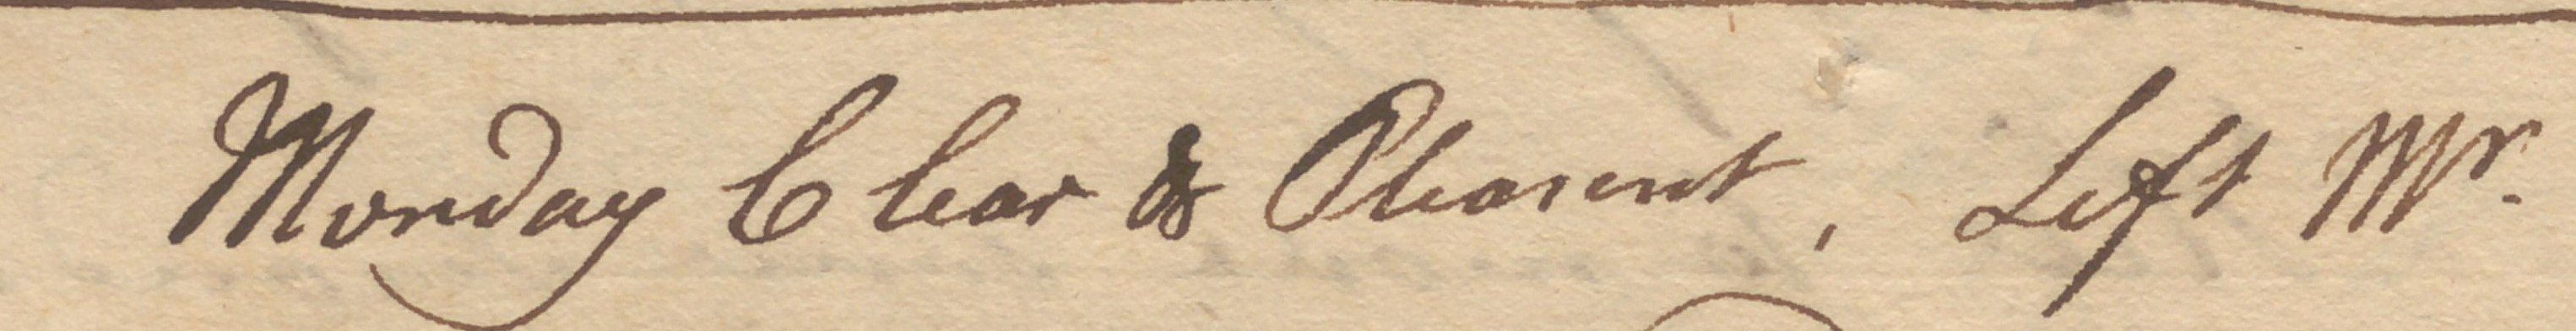Monday Clear & Pleasent, Left M^r.
